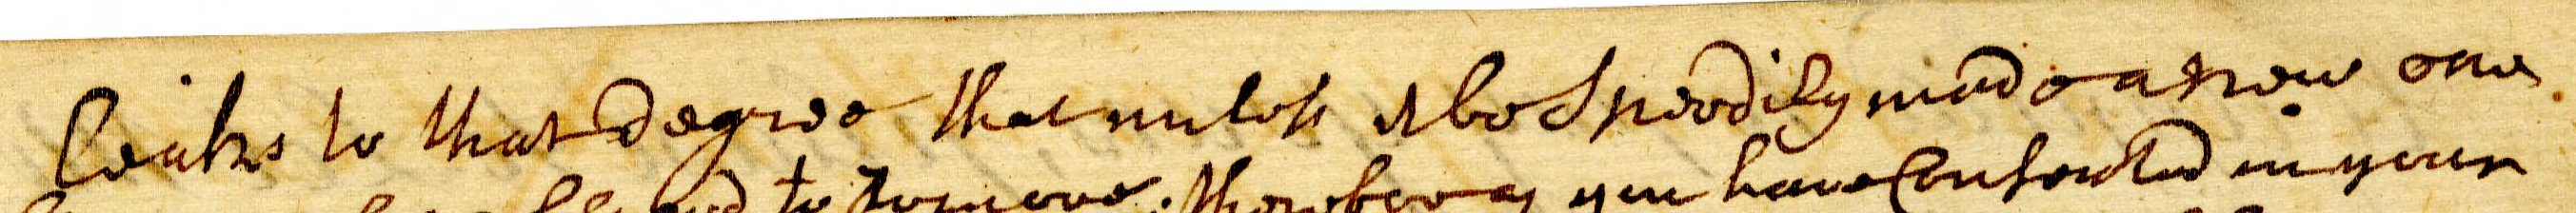leaks to that degree that unless it be speedily made a new one
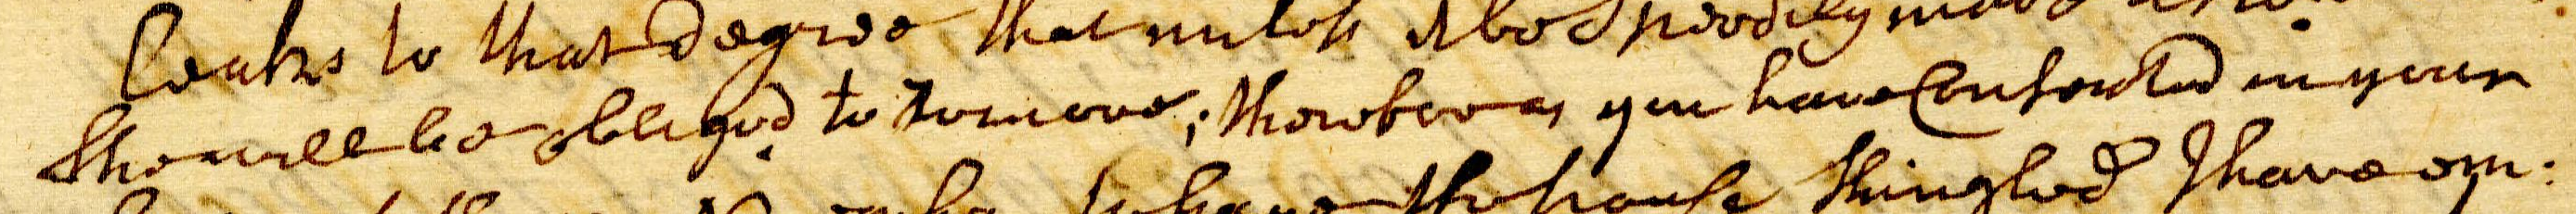She will be obliged to remove; therefore as you have Consented in your
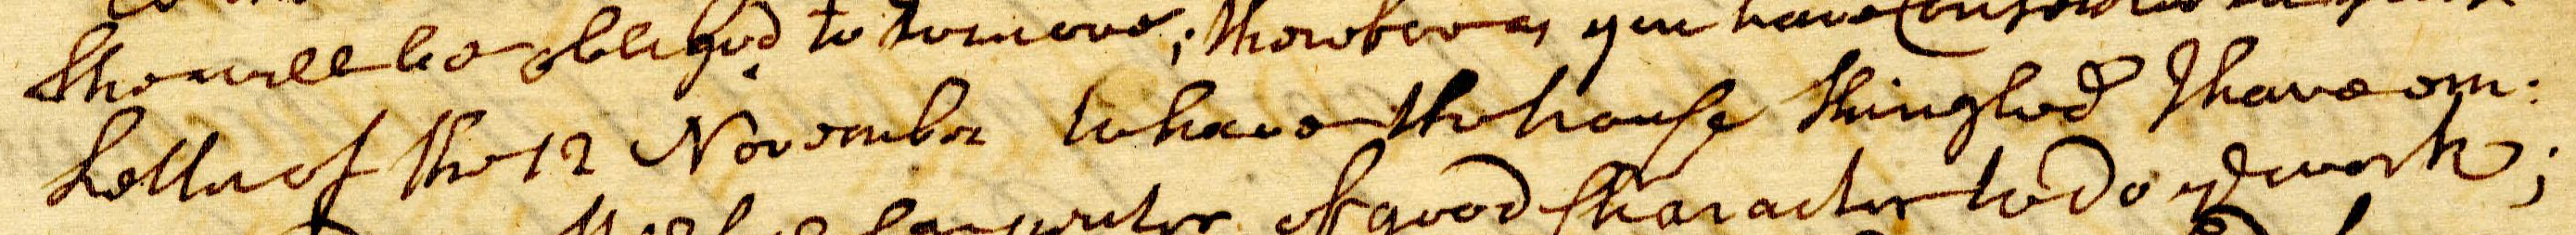Letter of the 12 November to have the house shingled I have em:
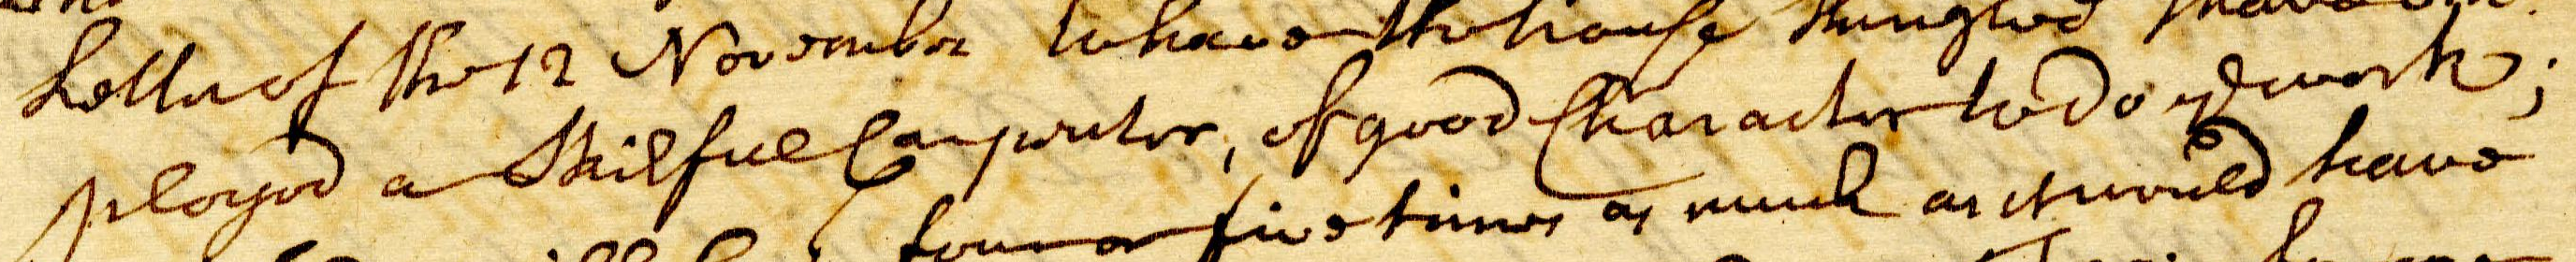ployed a Skilful Carpenter, of good Character to do y^e work;
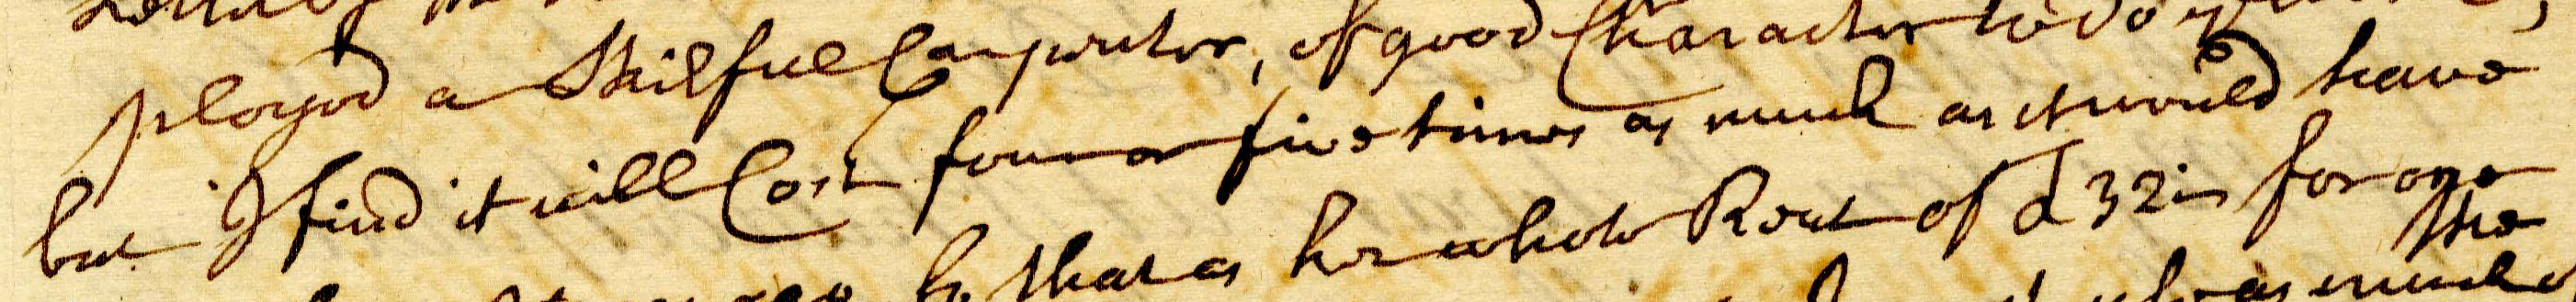but I find it will Cost four or five times as much as it would have
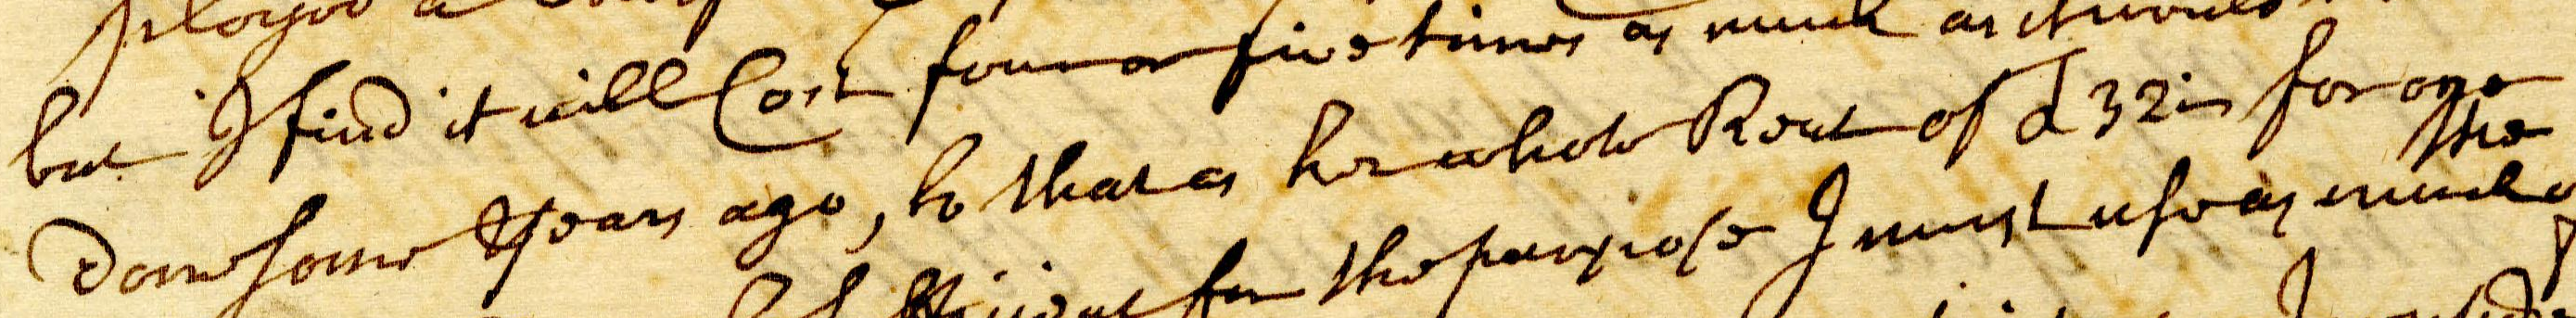done four Years ago, so that as her whole Rent of d 32 in for one
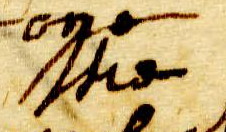the
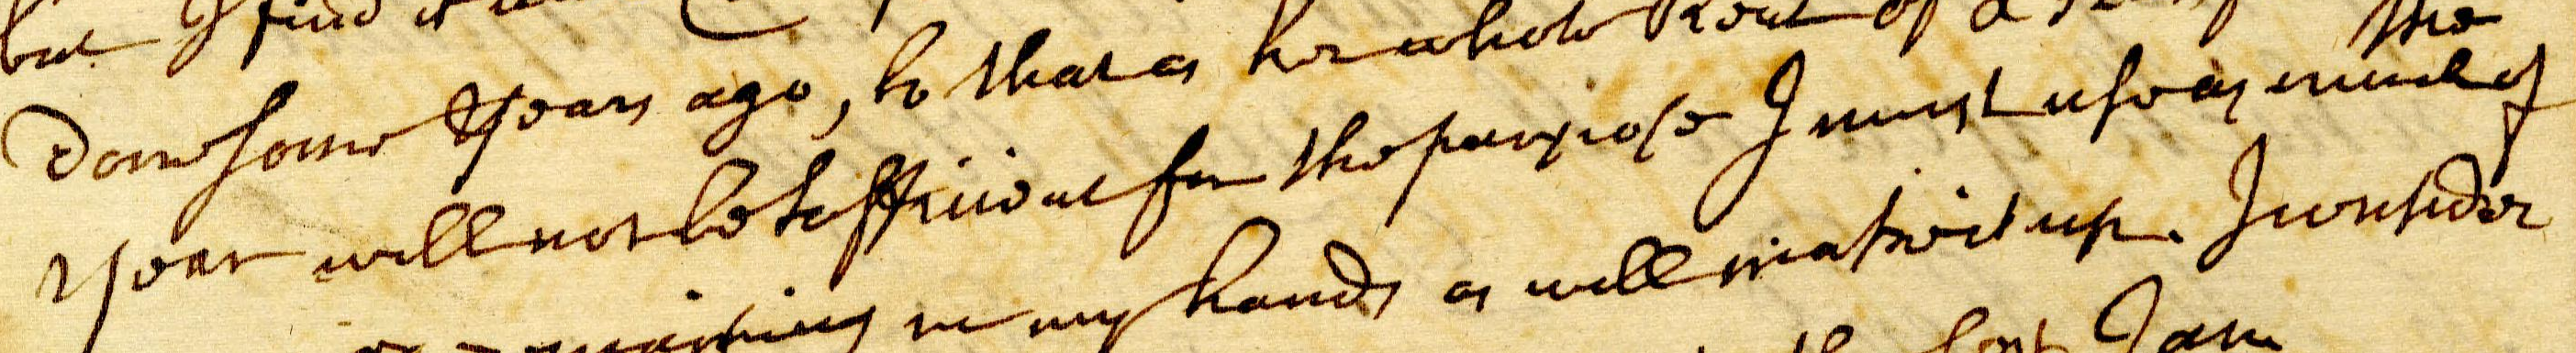Year will not be sufficient for the purpose I must use as much of
